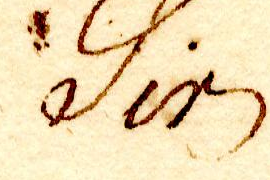Sir
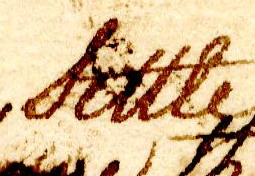Settle
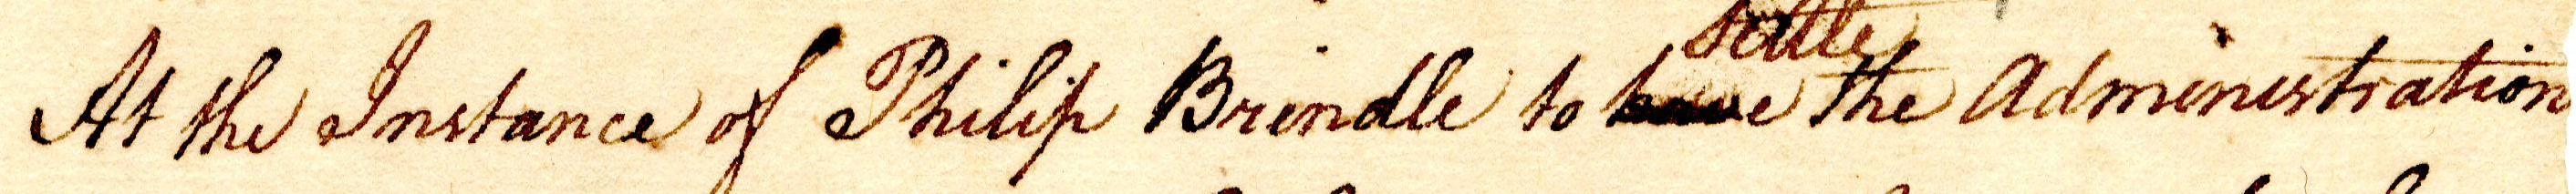At the Instance of Philip Brendle to have the Administration
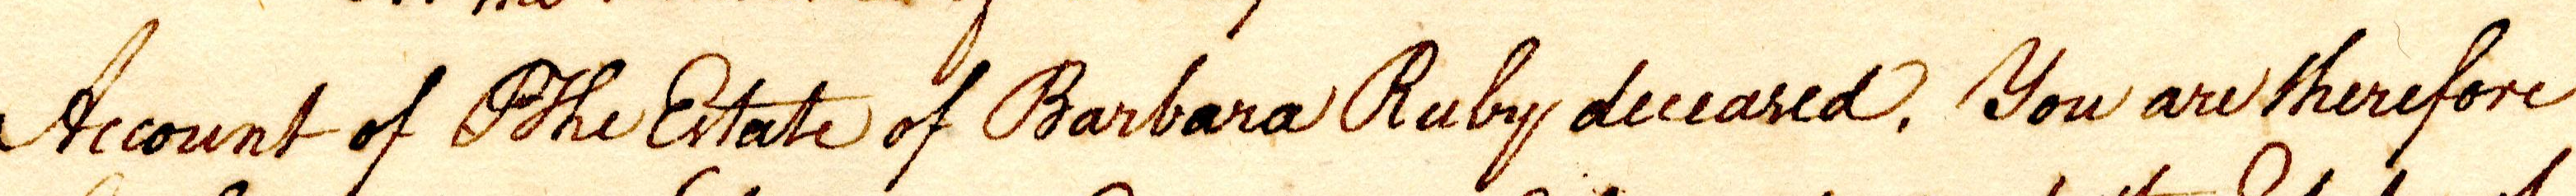Account of the Estate of Barbara Ruby deceased. You are therefore
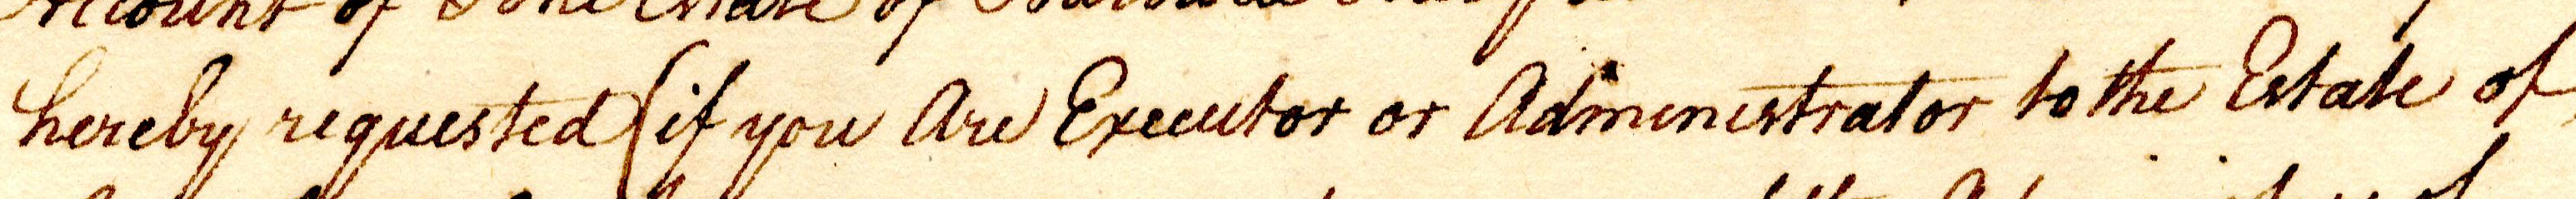hereby requested (if you Are Executor or Administrator to the Estate of
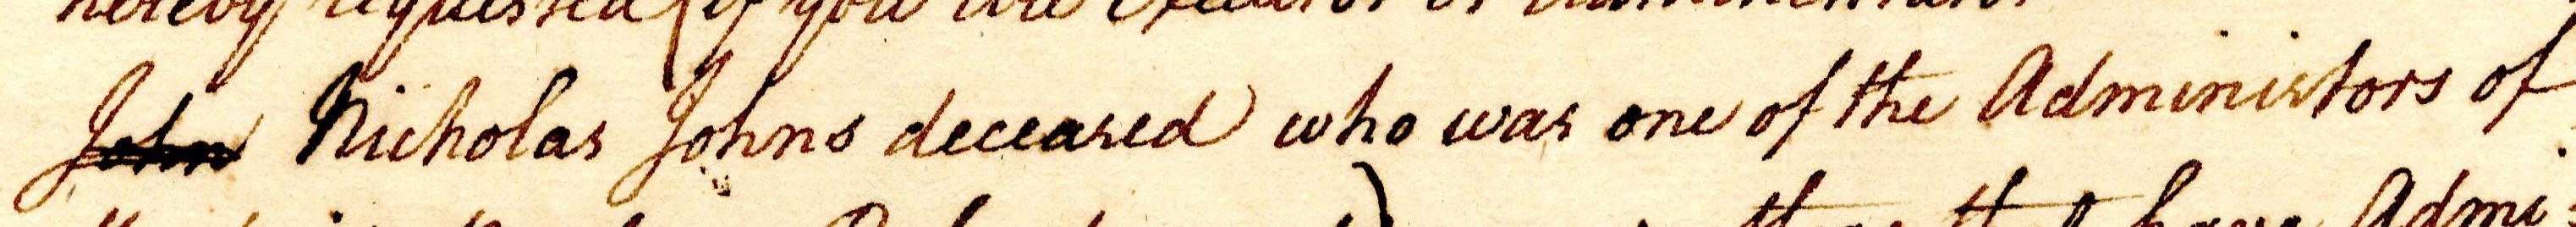John Nicholas Johns deceased who was one of the Administors of
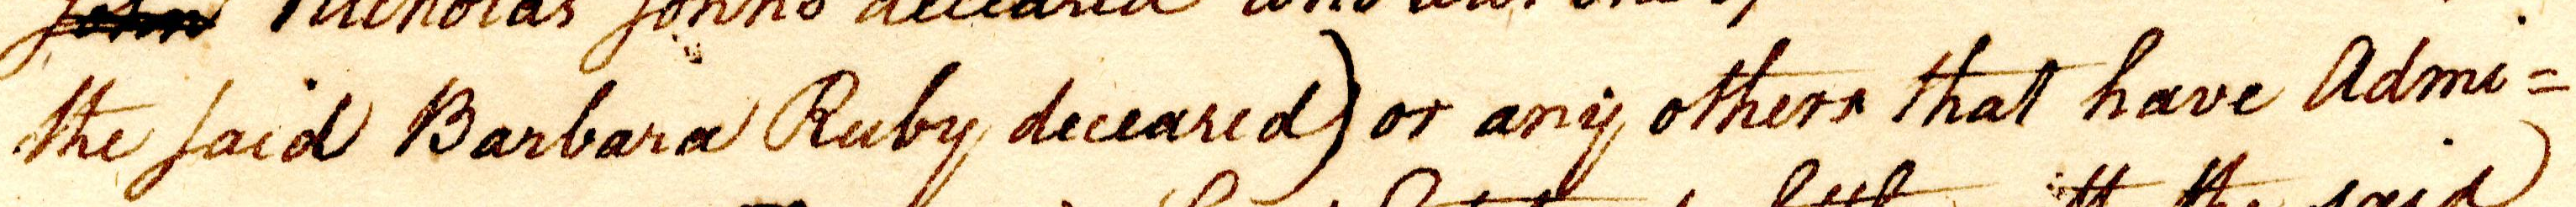the said Barbara Ruby deceased) or any others that have Admi-
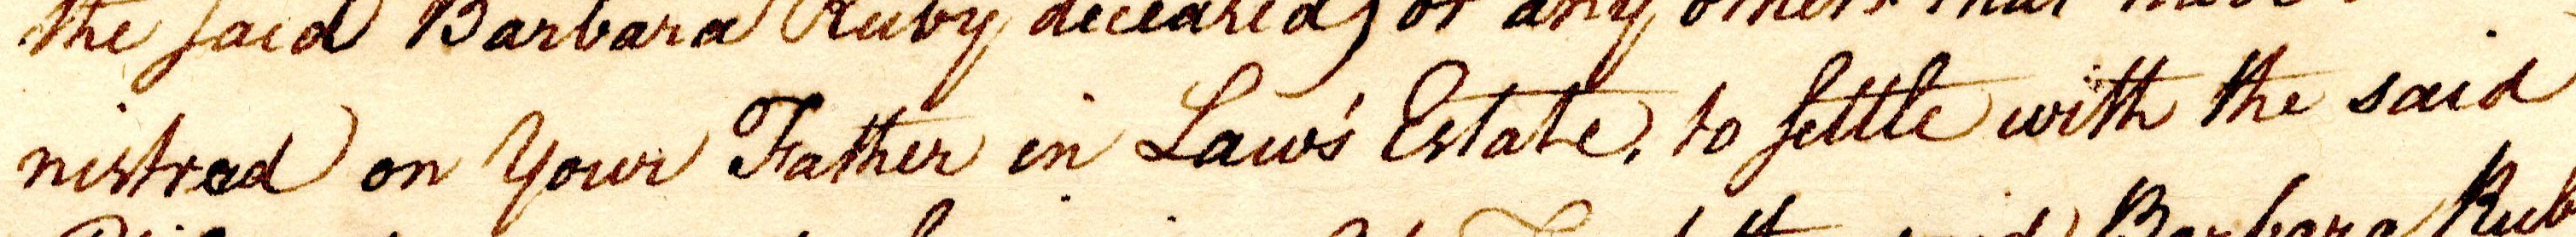-nistred on Your Father in Law's Estate, to settle with the said
